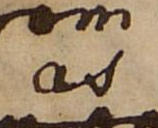as
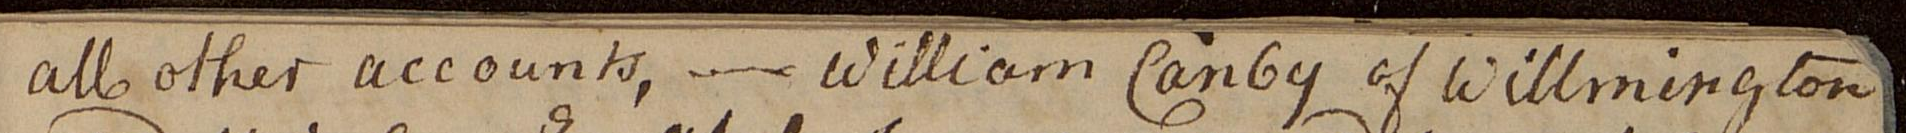all other accounts,- William Canby of Willmington
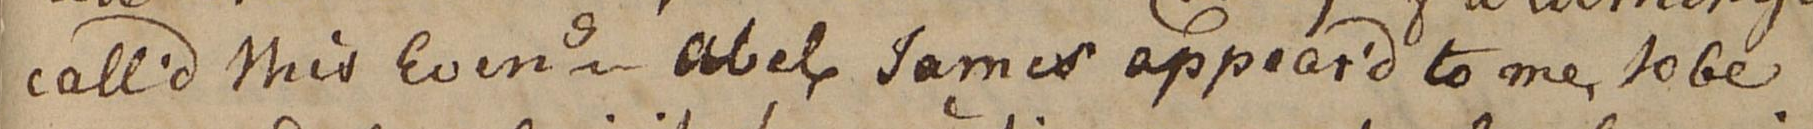call'd this Even^g. Abel James appear'd to me to be
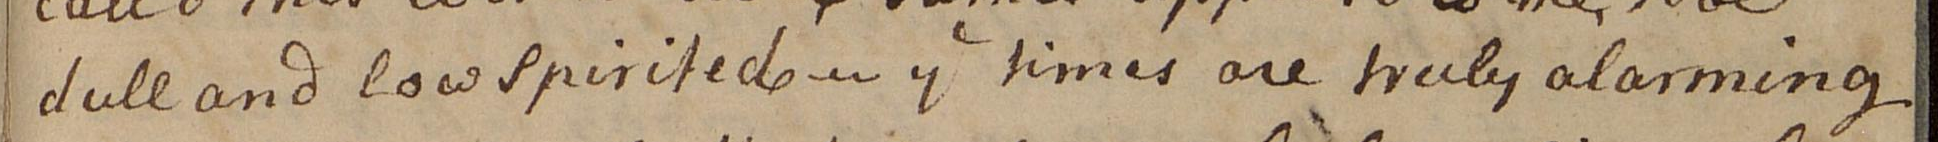dull and low Spirited - y^e times are truly alarming
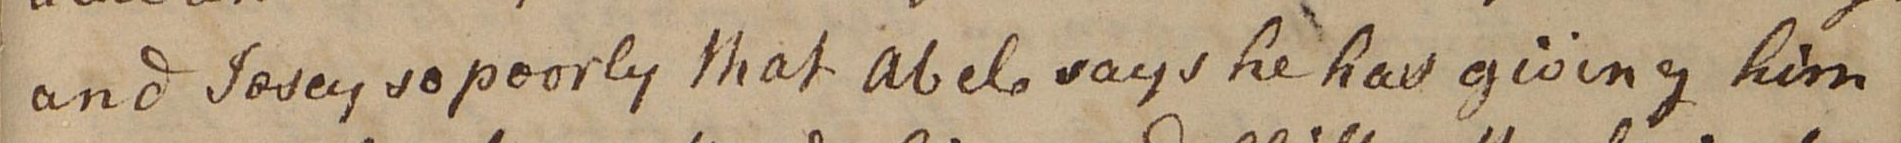and Josey so poorly that Abel says he has giving him
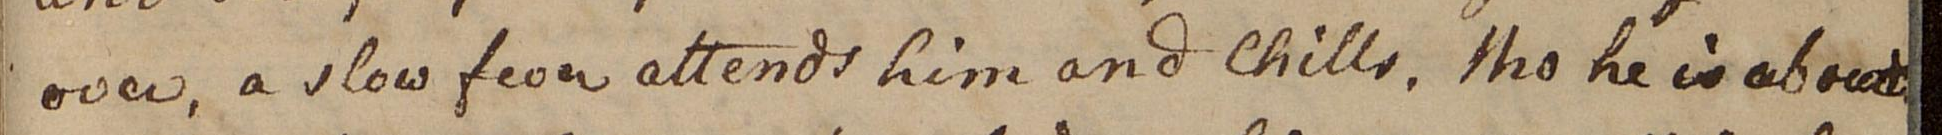over, a slow fever attends him and Chills, tho he is about
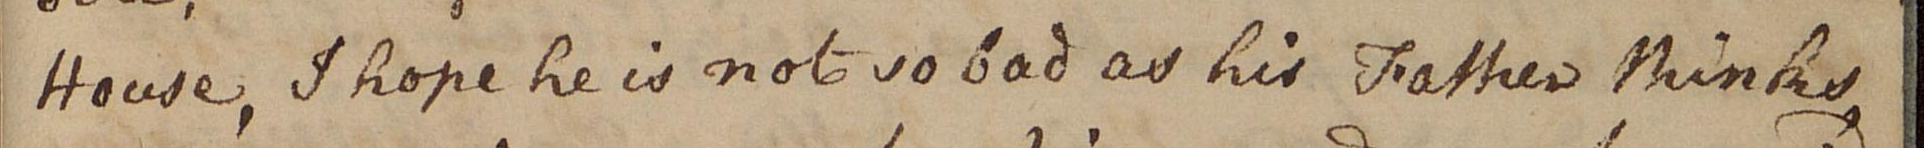House, I hope he is not so bad as his Father thinks,
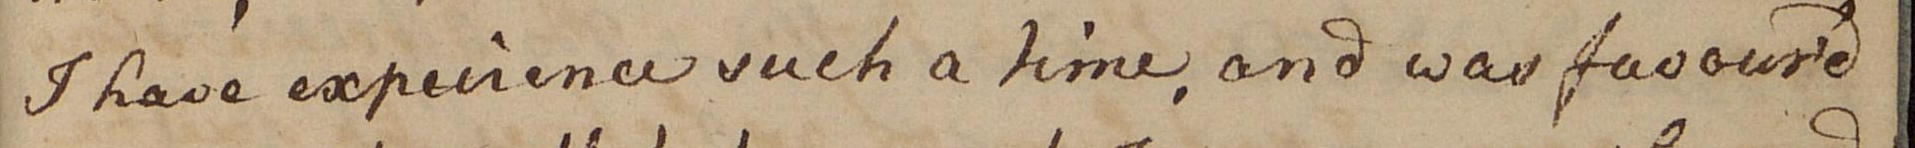I have expeirence such a time, and was favour'd
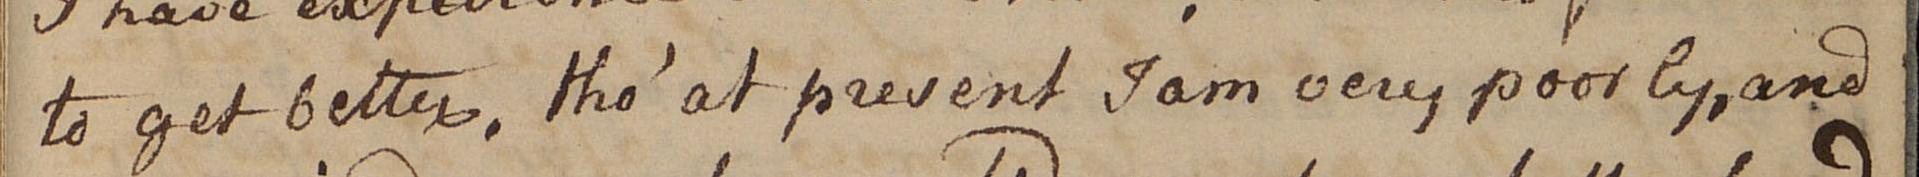to get better, tho' at present I am very poorly, and
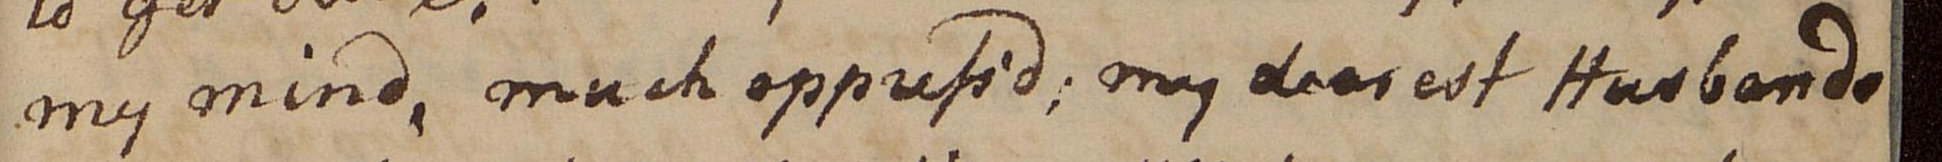my mind, much oppress'd; my dearest Husbands
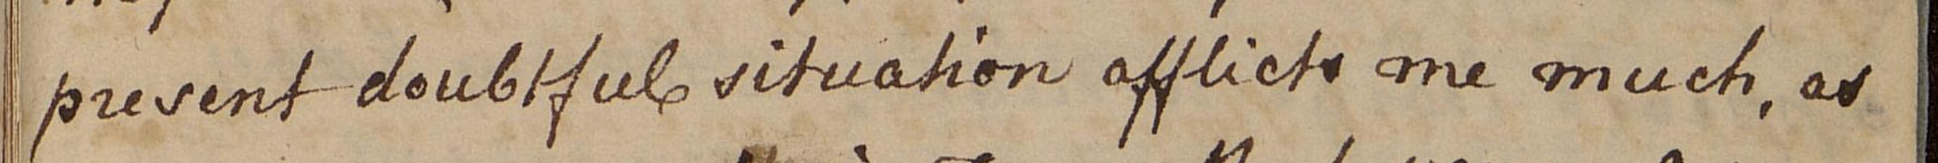present doubtful situation afflicts me much, as
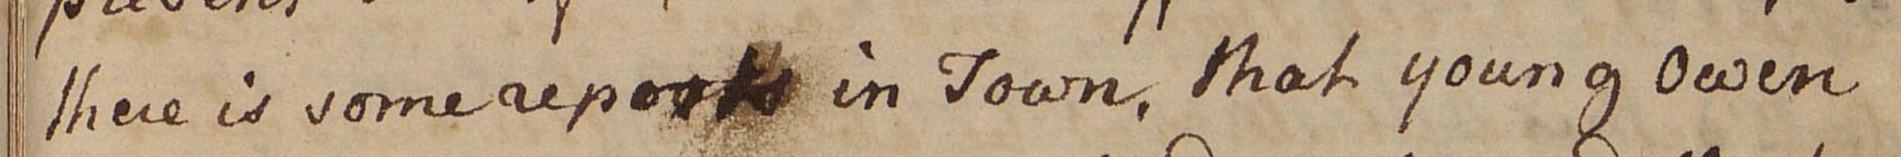there is some reports in Town, that young Owen
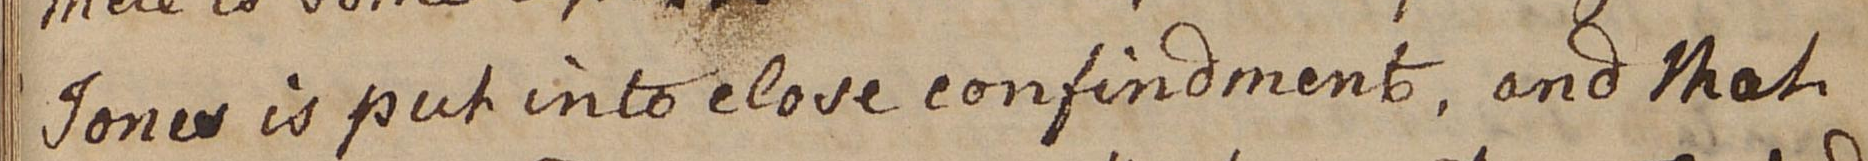Jones is put into close confindment, and that
